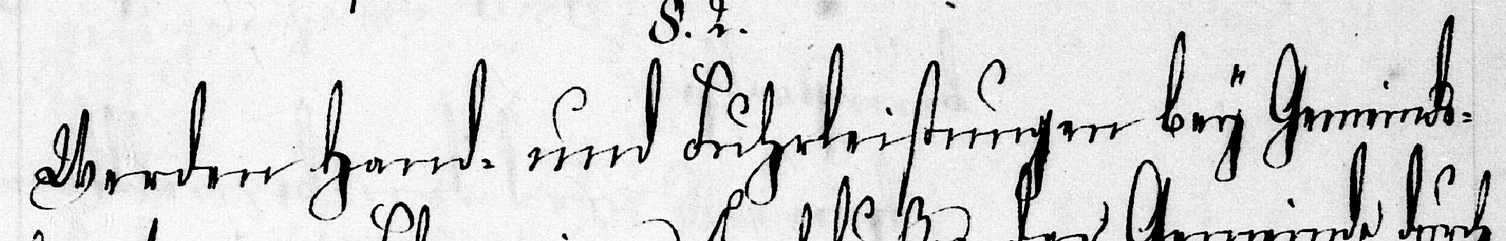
Werden Hand- und Fuhrleistungen bey G6emeind¬
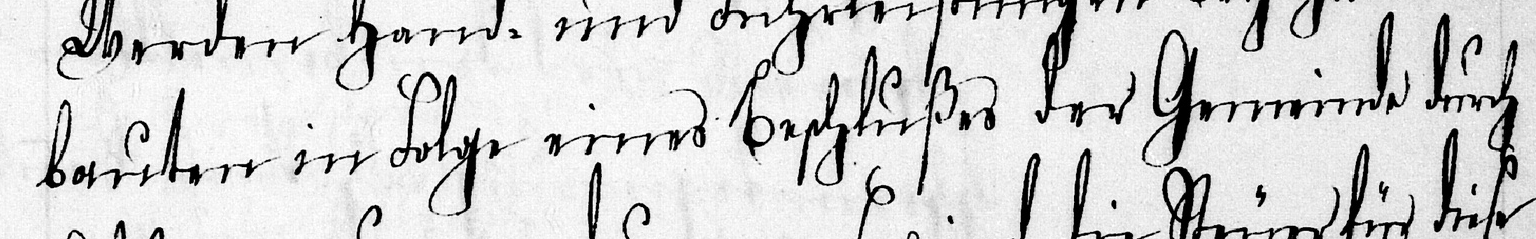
sbauten in Folge eines Beschlußes der Gemeinde durch
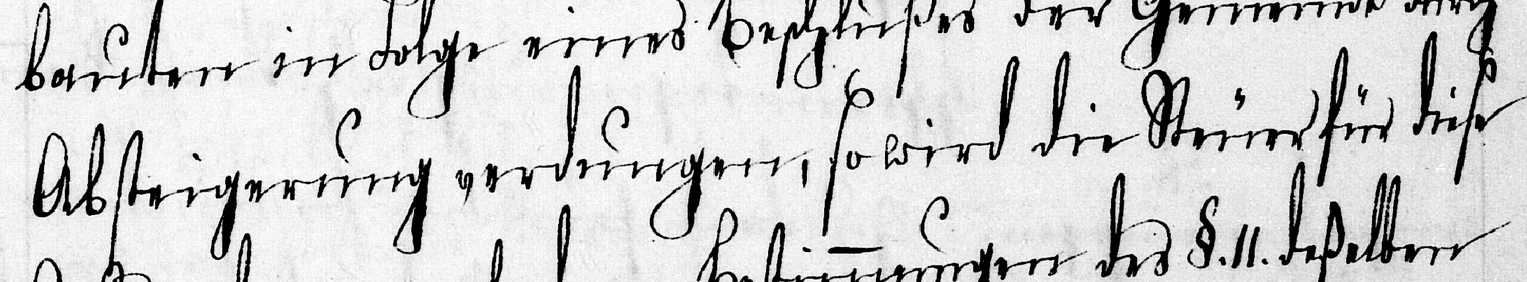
Absteigerung verdungen, so wird die Steuer für diese
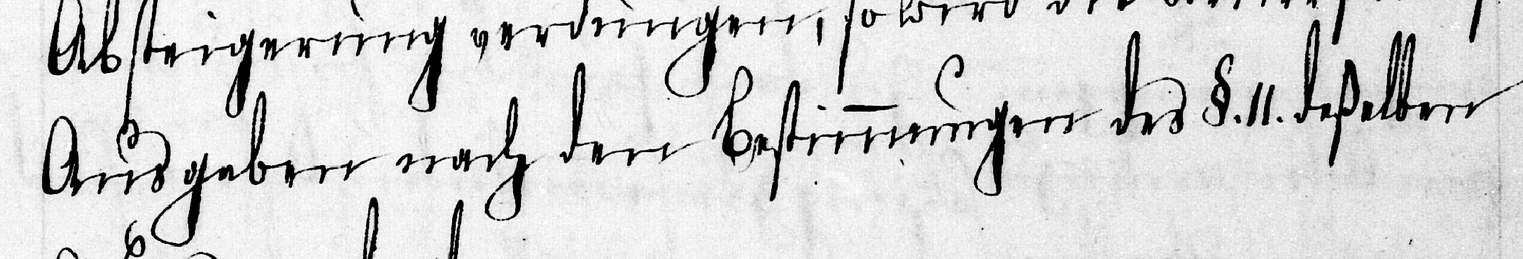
Ausgaben nach den Bestimmungen des §. 11. deßelben
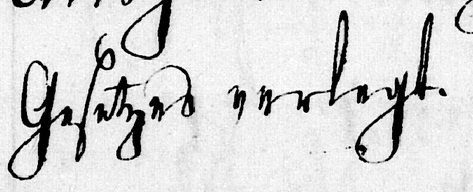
Gesetzes verlegt.
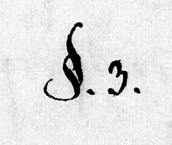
§. 3.
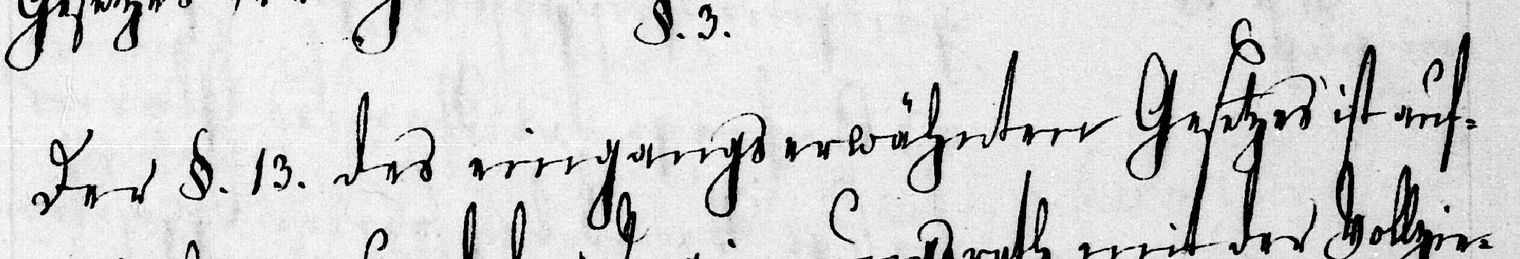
Der §. 13. des eingangserwähnten Gesetzes ist auf¬
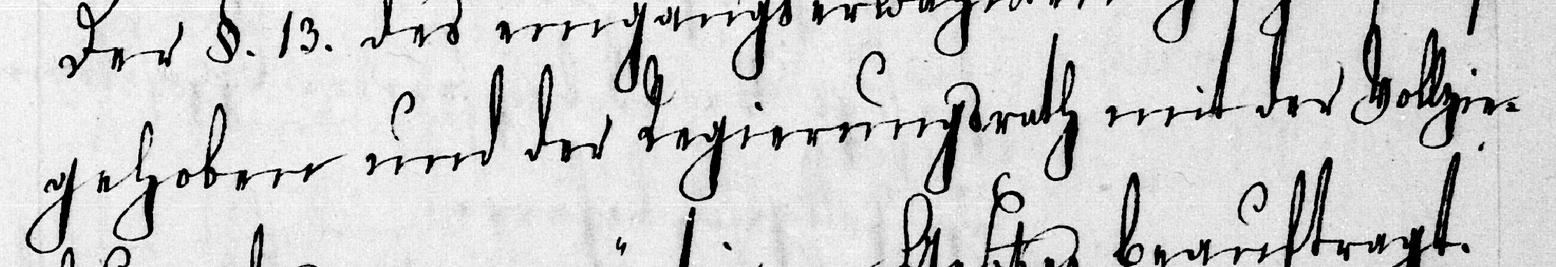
gehoben und der Regierungsrath mit der Vollzie¬
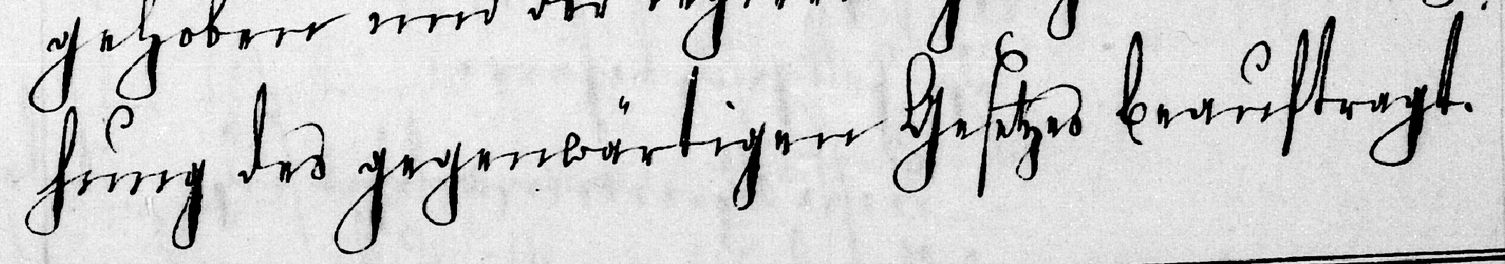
hung des gegenwärtigen Gesetzes beauftragt.
